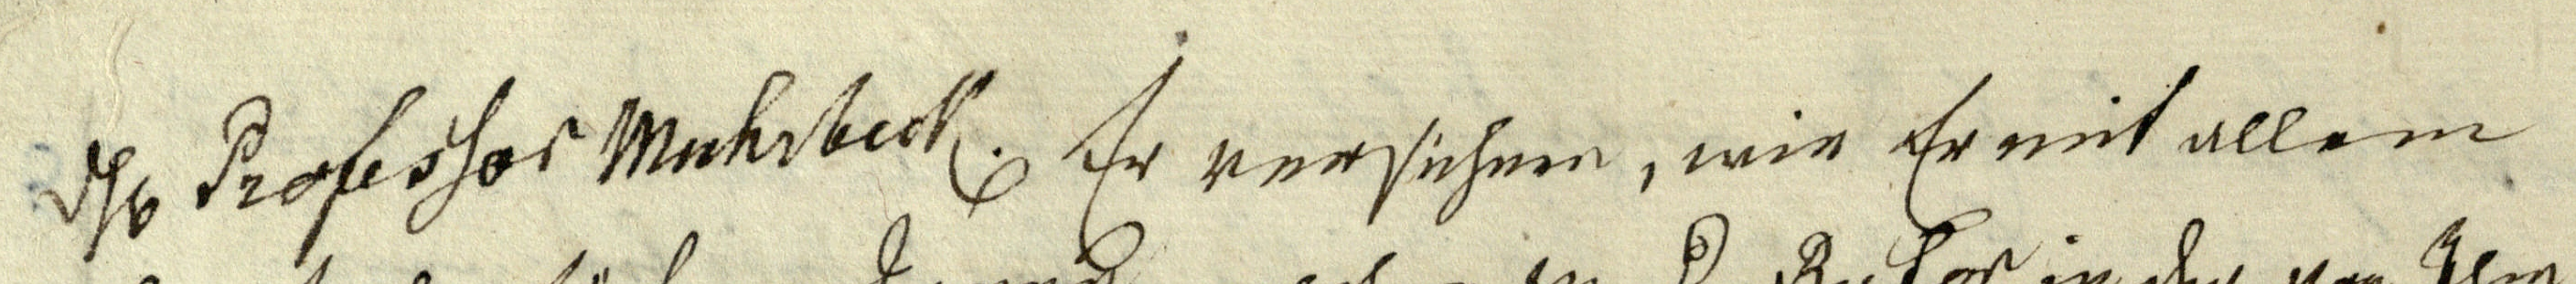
dh Professor Muhrbeck. Er versichere, wie Er mit allem
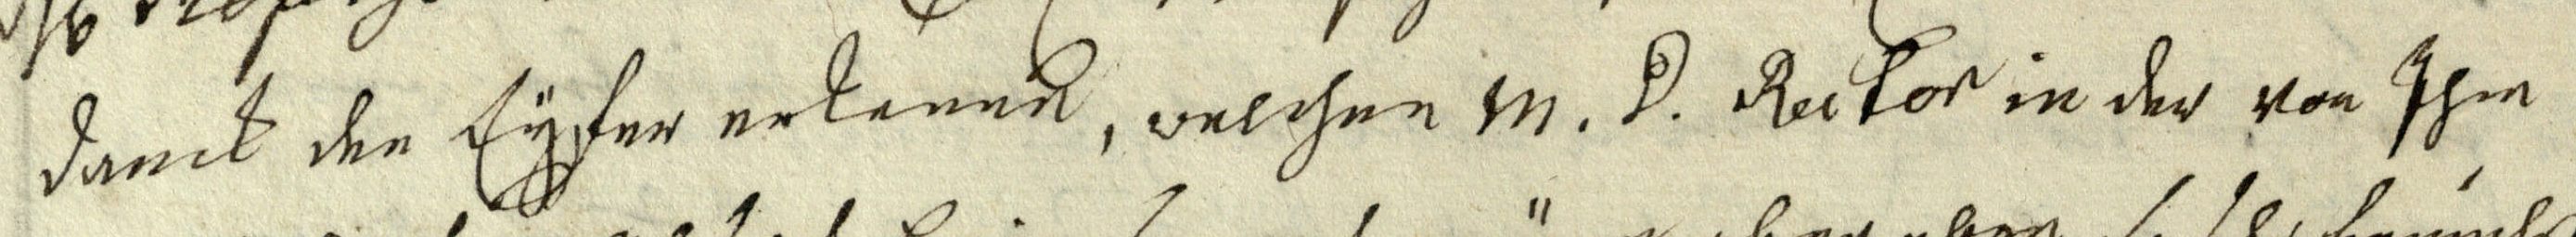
Danck den Eÿfer erkenne, welchen M. D. Rector in der von Ihm
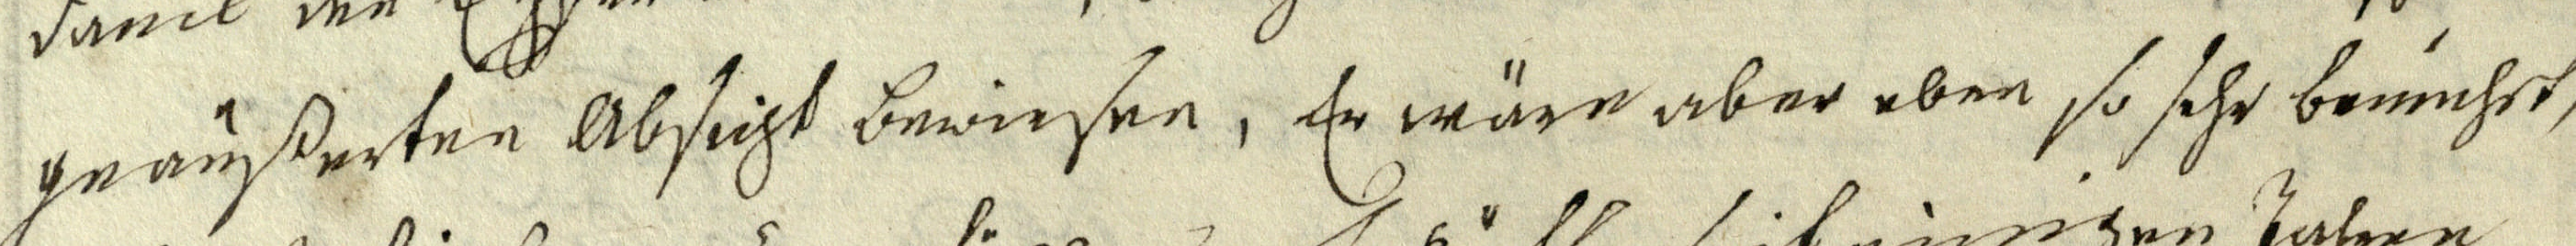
geäußerten Absicht bewiesen, Er wäre aber eben so sehr bemühet,
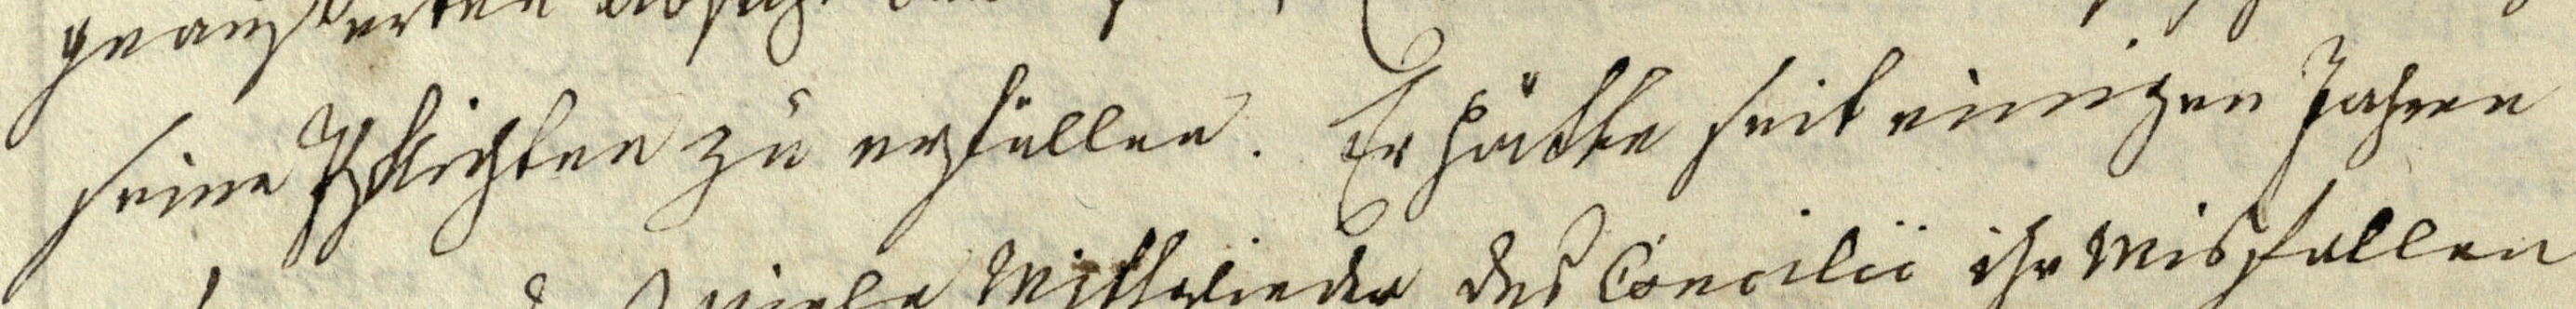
seine Pflichten zu erfüllen. Er hätte seit einigen Jahren
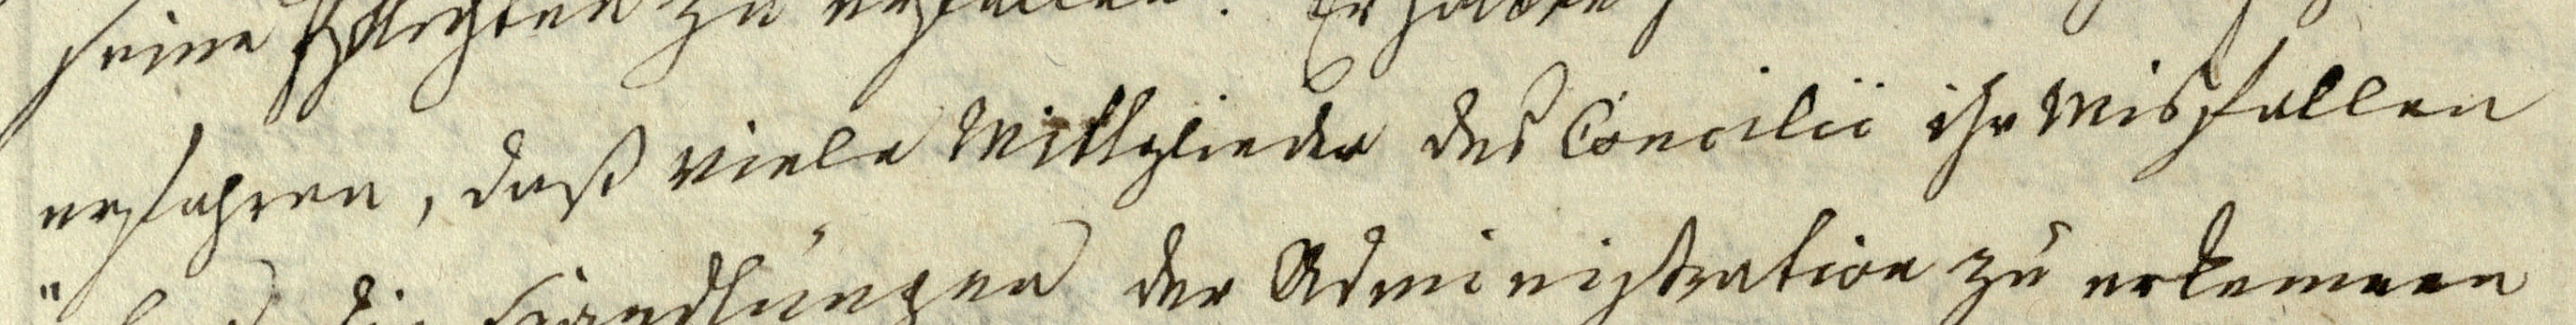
erfahren, daß viele Mittglieder des Concilii ihr Misfallen
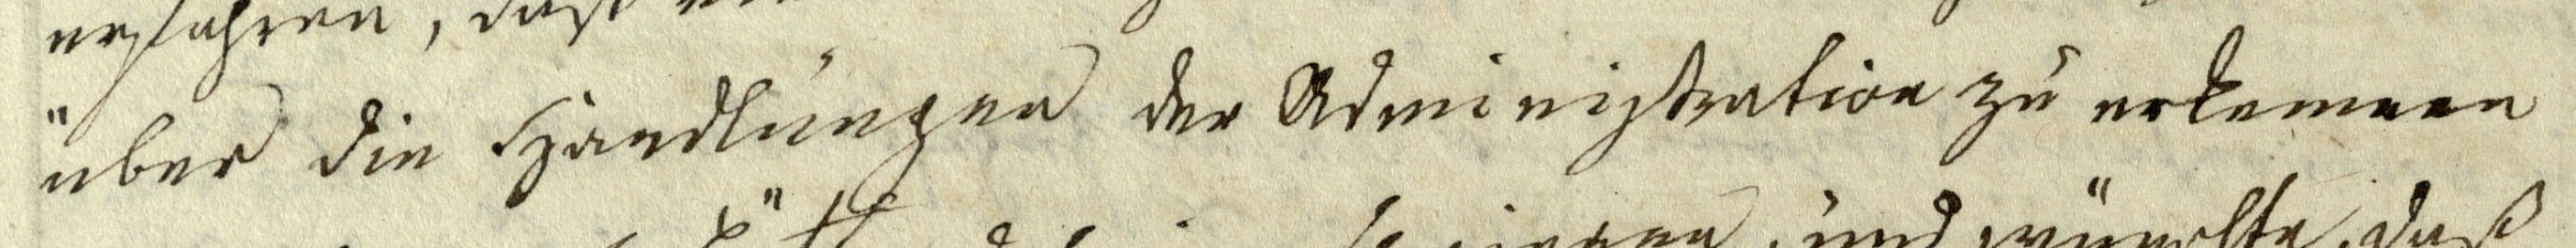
über die Handlungen der Administration zu erkennen
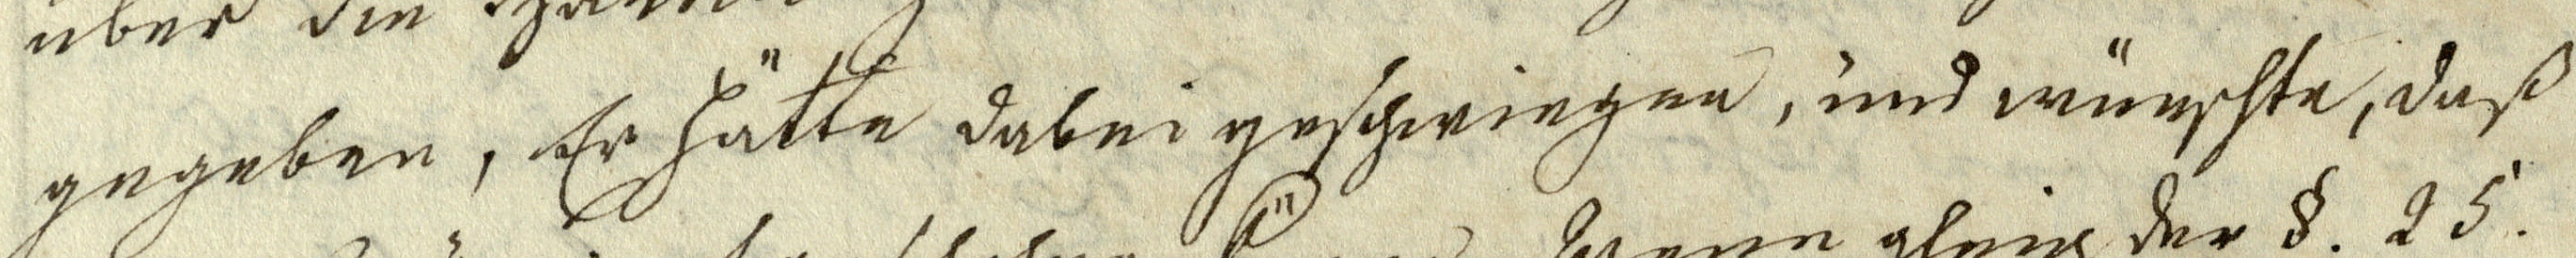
gegeben, Er hätte dabei geschwiegen, und wünschte, daß
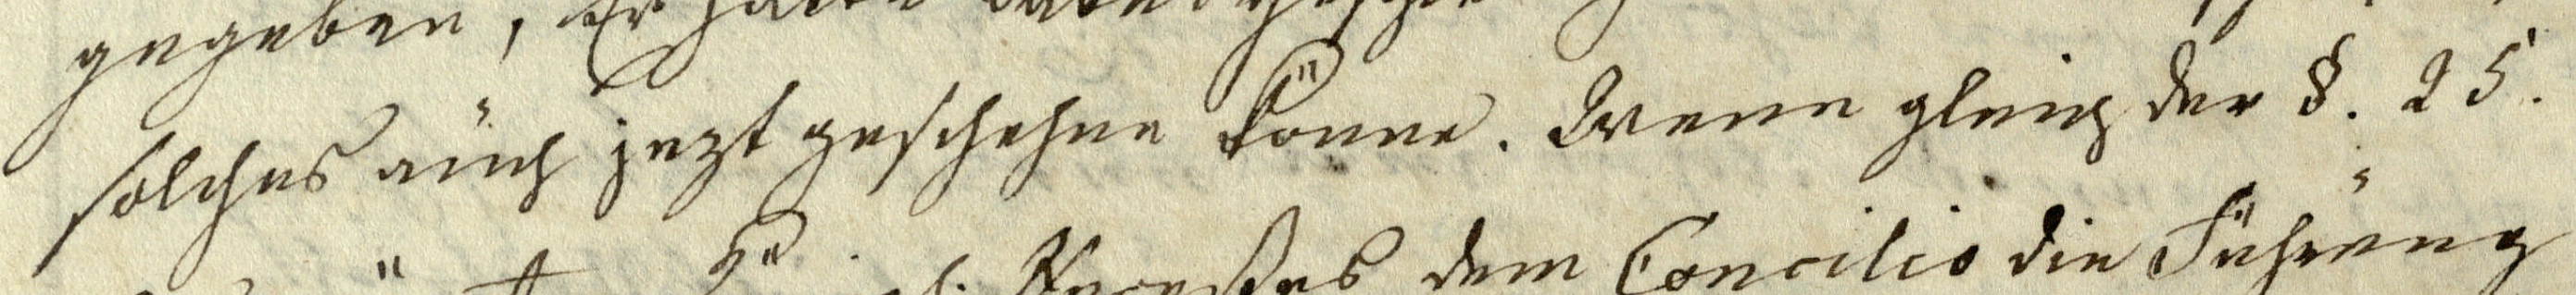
solches auch jezt geschehen könne. Wenn gleich der §. 25.
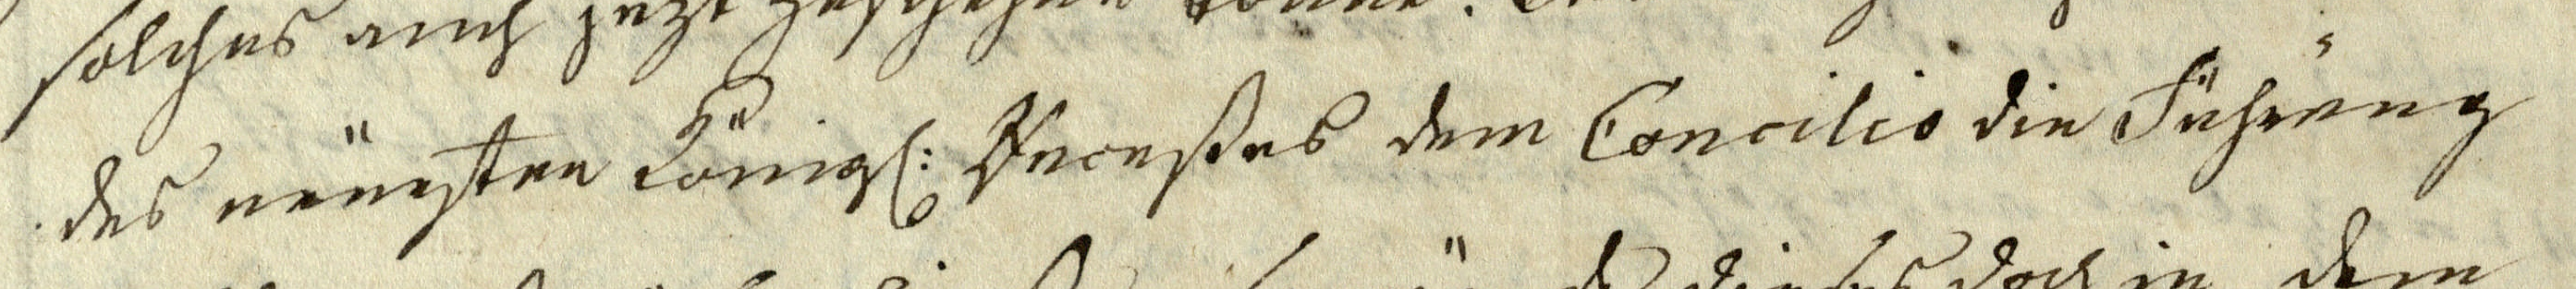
des neuesten Königl. Receßes dem Concilio die Führung
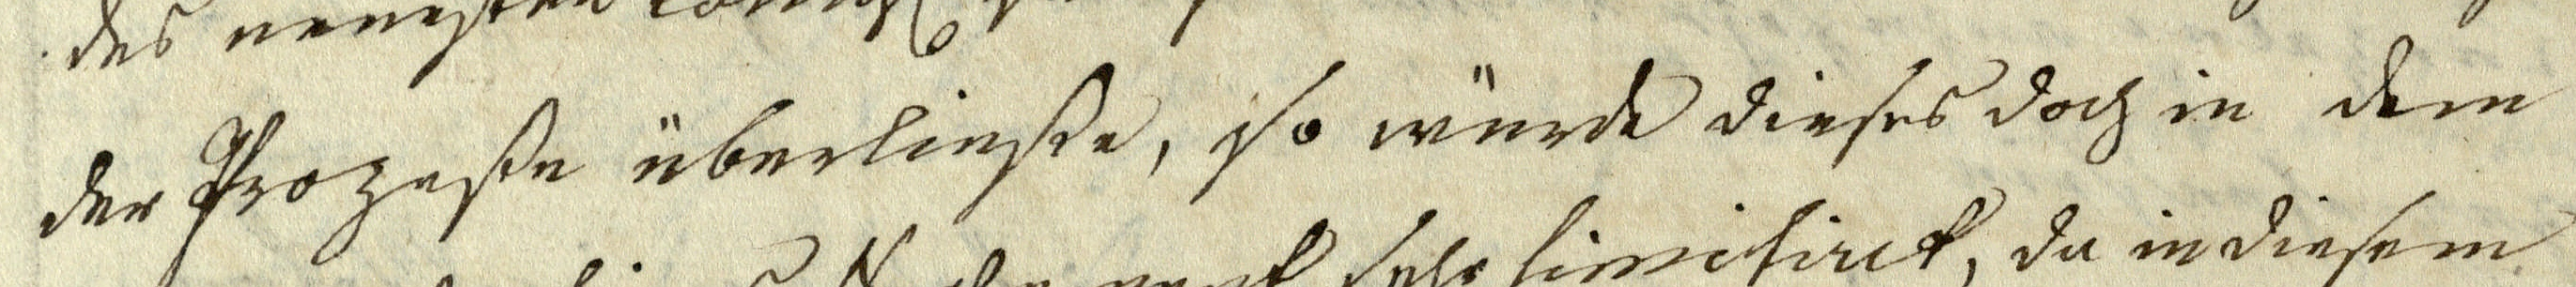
der Prozeßeüberließe, so würde dieses doch in dem
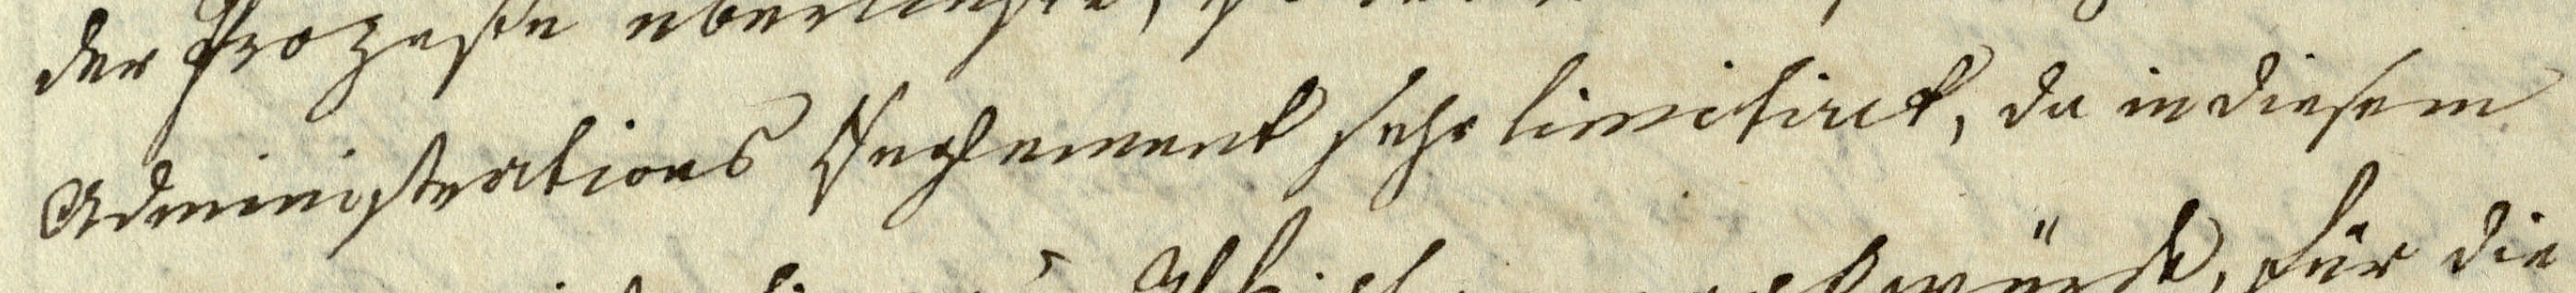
Administrations Reglement sehr limitiret, da in diesem
